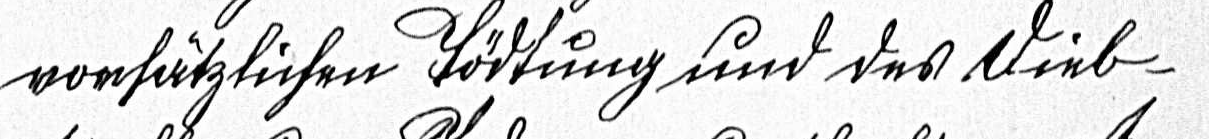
vorsätzlichen Tödtung und des Dieb¬
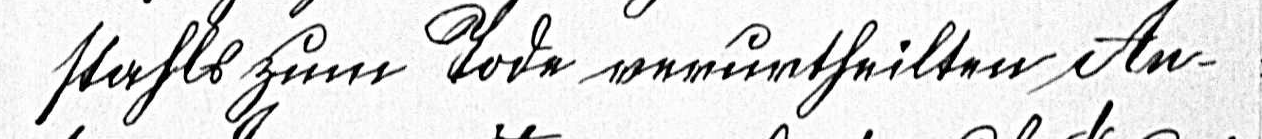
stahls zum Tode verurtheilten An¬
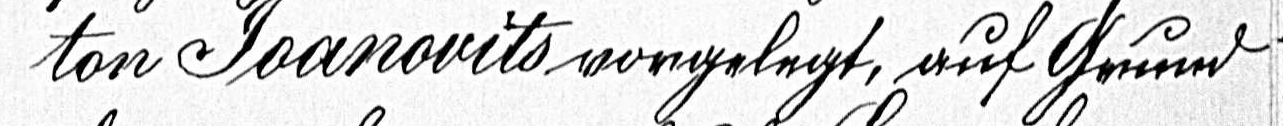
ton Ioanovits vorgelegt, auf Grund
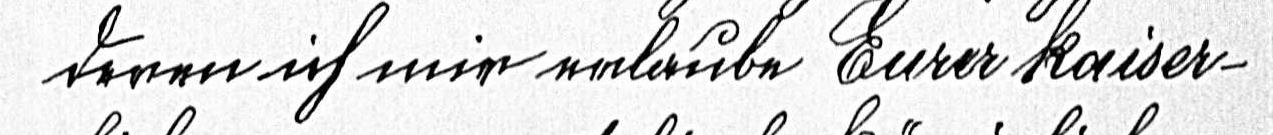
deren ich mir erlaube Eurer Kaiser¬
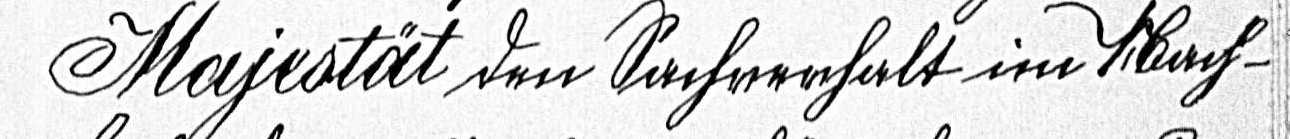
Majestät den Sachverhalt im Nach¬
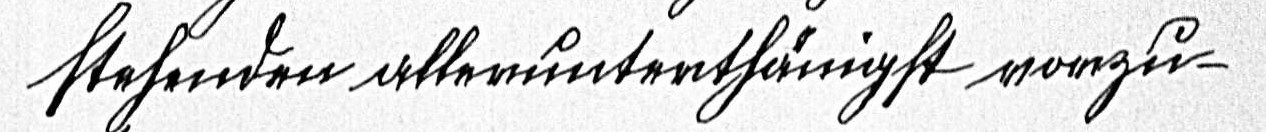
stehenden allerunterthänigst vorzu¬
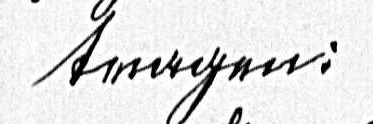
tragen:
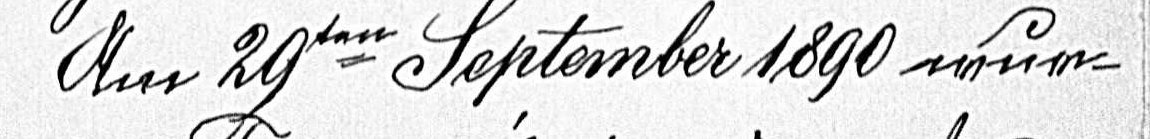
Am 29ten September 1890 wur¬
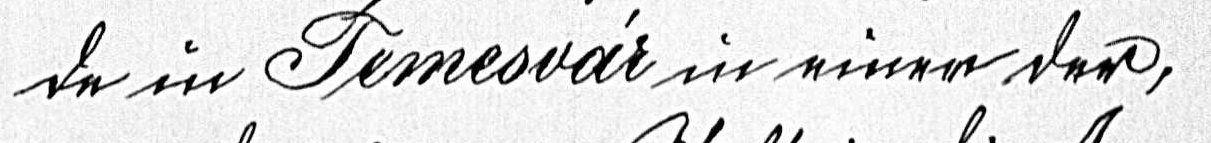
de in Temesvár in einer der,
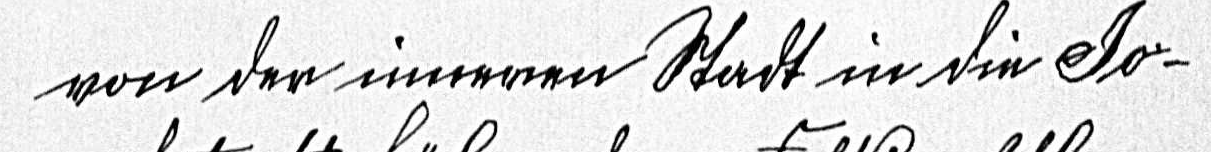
von der inneren Stadt in die Jo¬
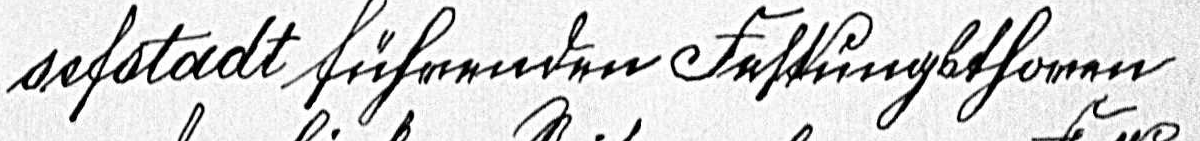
sefstadt führenden Festungsthoren
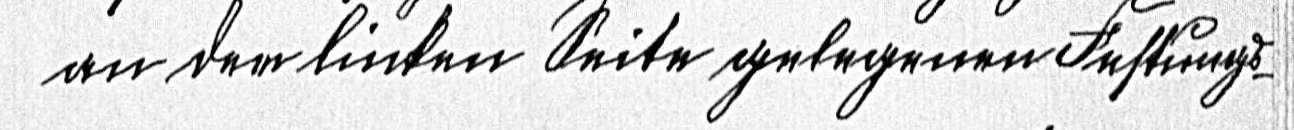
an der linken Seite gelegenen Festungs¬
